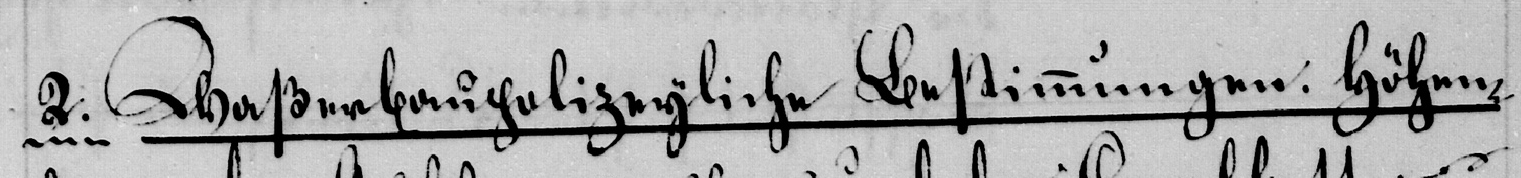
2. Waßerbaupolizeyliche Bestimmungen. Höhen¬
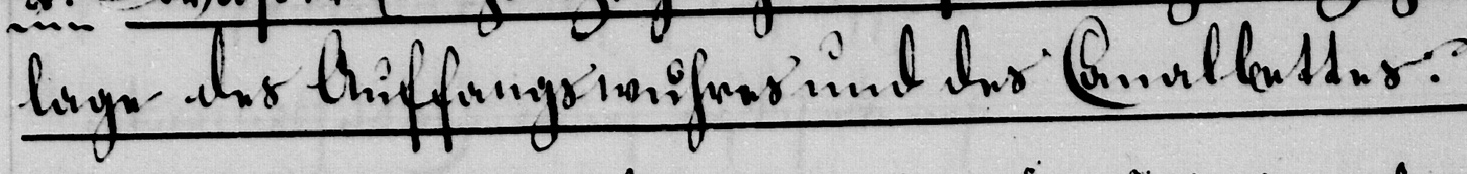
lage des Auffangswuhres und des Canalbettes.
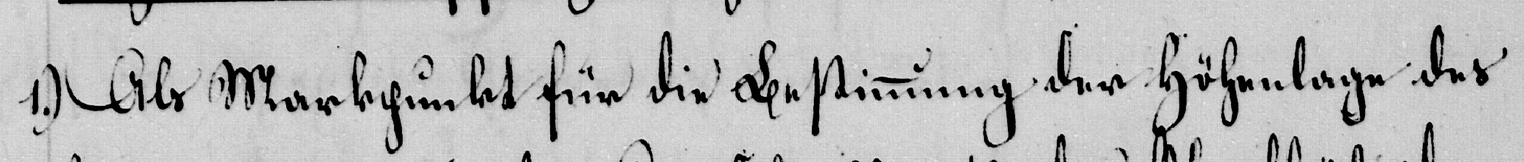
1.) Als Markpunkt für die Bestimmung der Höhenlage des
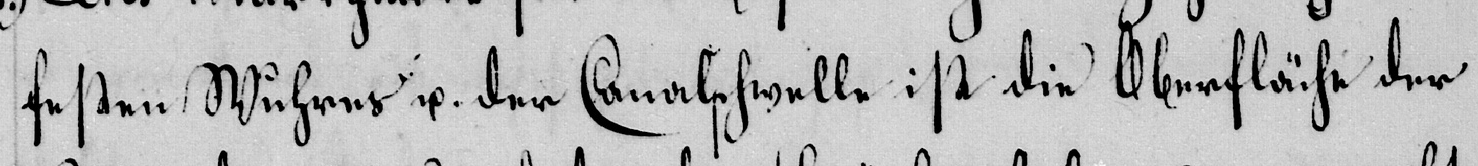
festen Wuhres u. der Canalschwelle ist die Oberfläche der
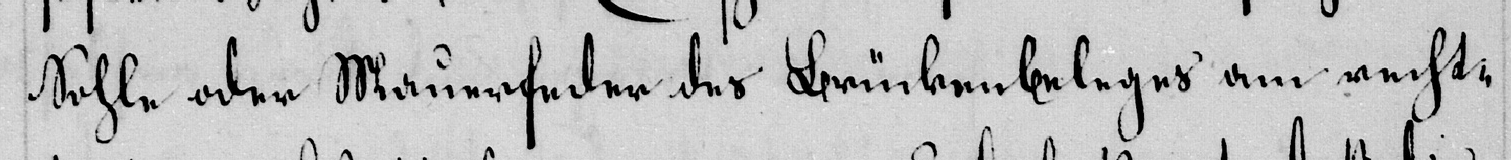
Sohle oder Mauerfeder des Brückenbeleges am recht¬
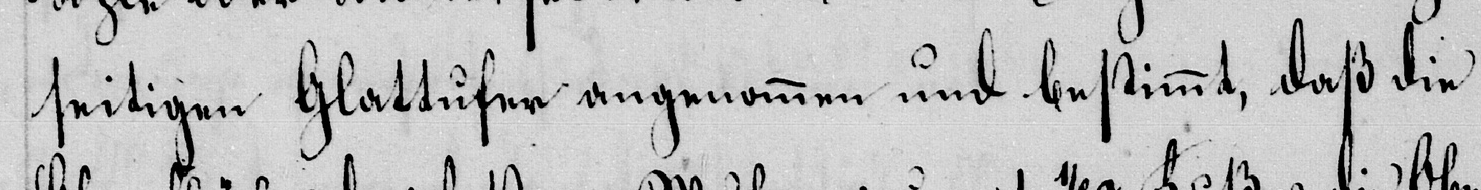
seitigen Glattufer angenommen und bestimmt, daß die
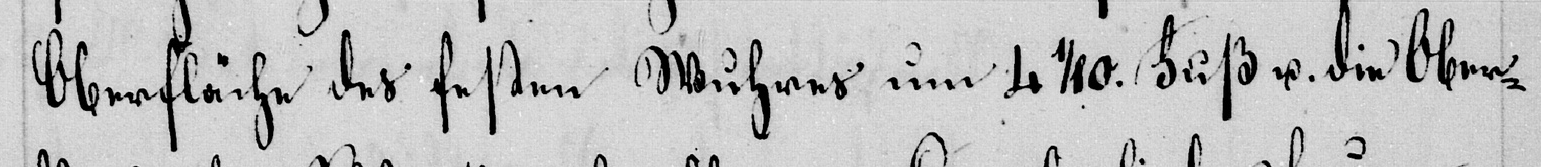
Oberfläche des festen Wuhres um 4 1/10. Fuß u. die Ober¬
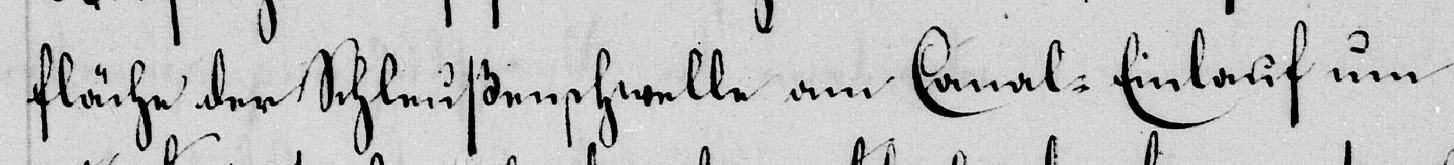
fläche der Schleußenschwelle am Canal-Einlauf um
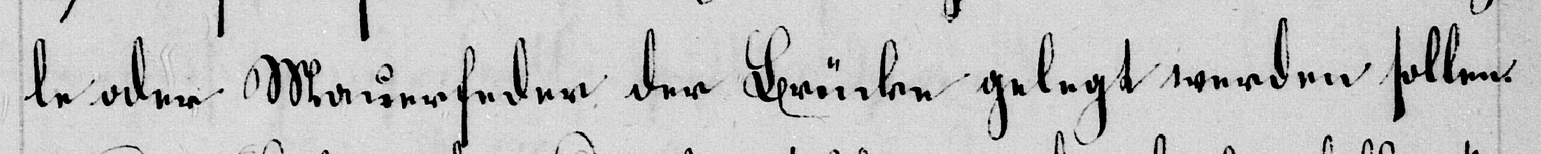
le oder Mauerfeder der Brücke gelegt werden sollen.
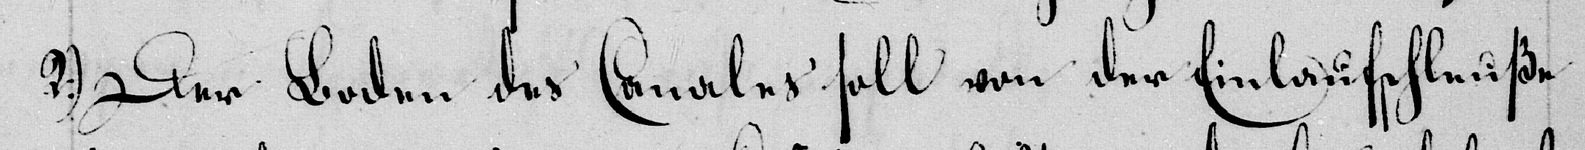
2.) Der Boden des Canales soll von der Einlaufschleuße
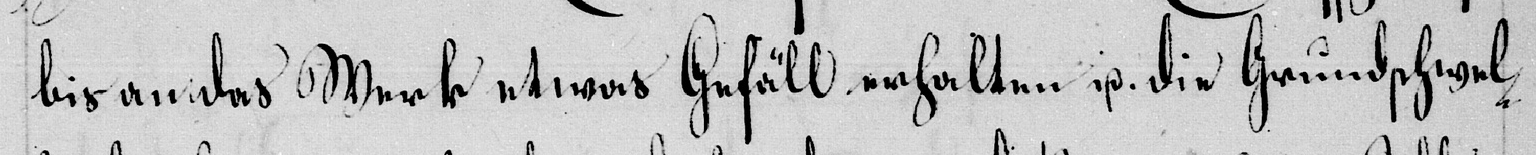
bis an das Merk etwas Gefäll erhalten u. die Grundschwel¬
